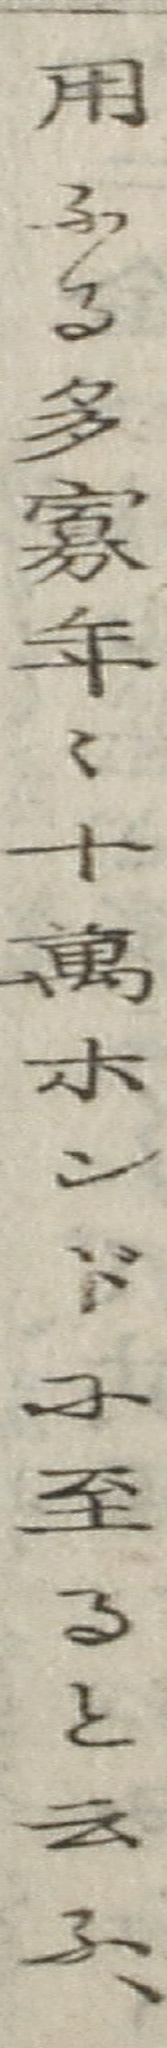用ふる多寡、年々十萬ホンドに至ると云ふ、
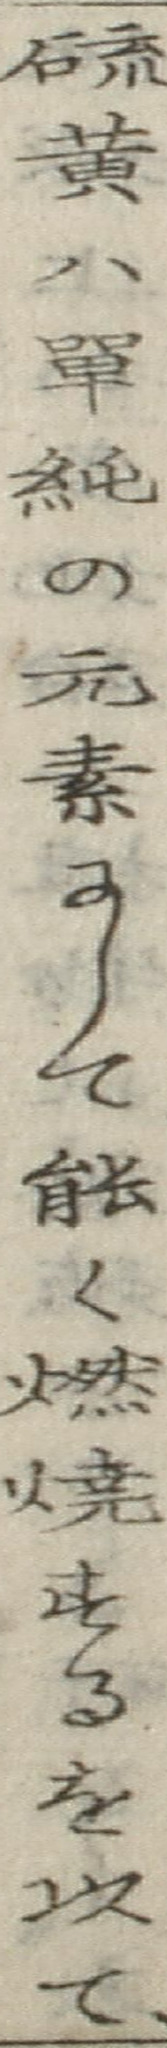硫黄は単純の元素にして、能く燃焼するを以て、
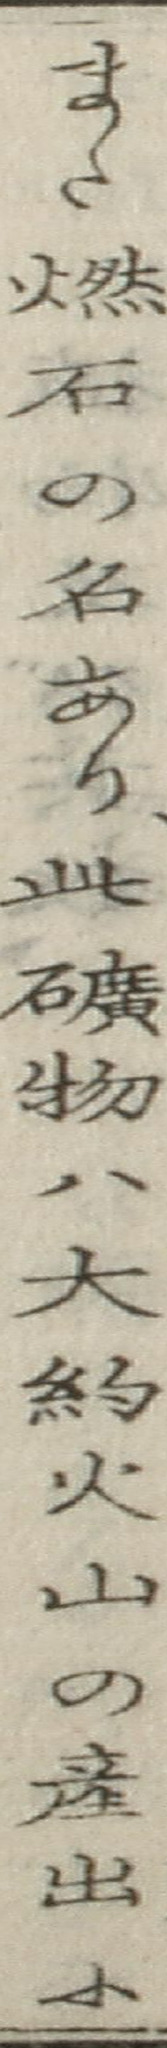また燃石の名あり、此砿物は大約火山の産出に
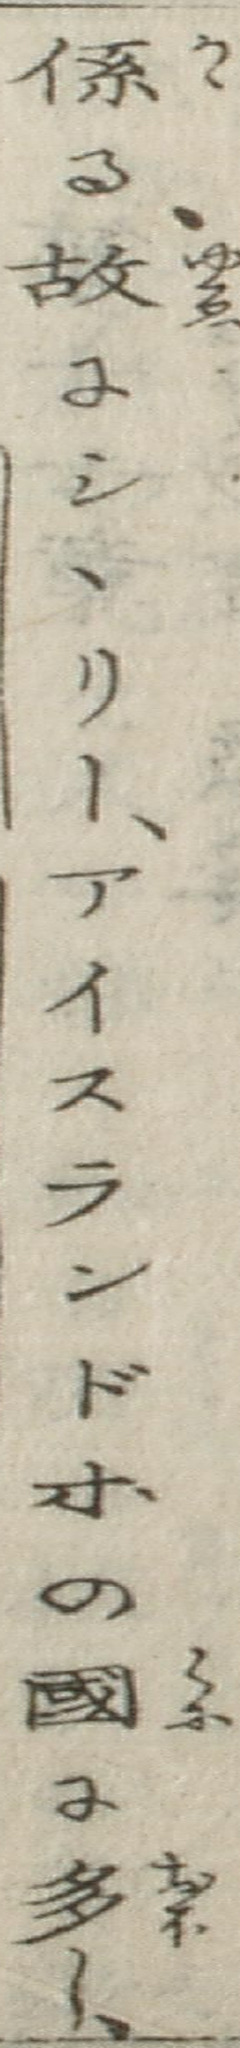係る、故にシヽリー、アイスランド等の國に多し、
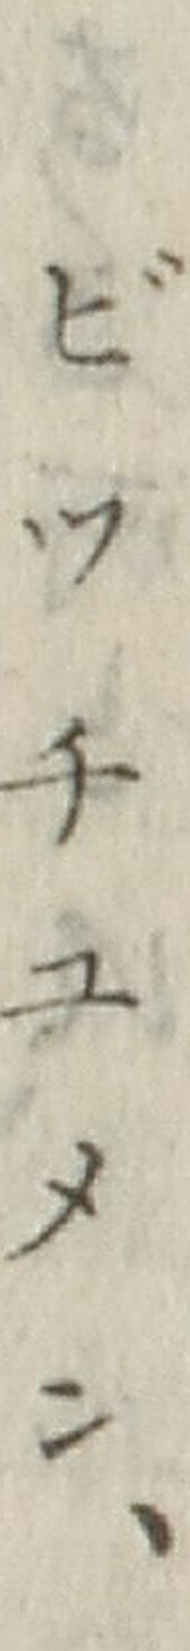ビツチユメン、
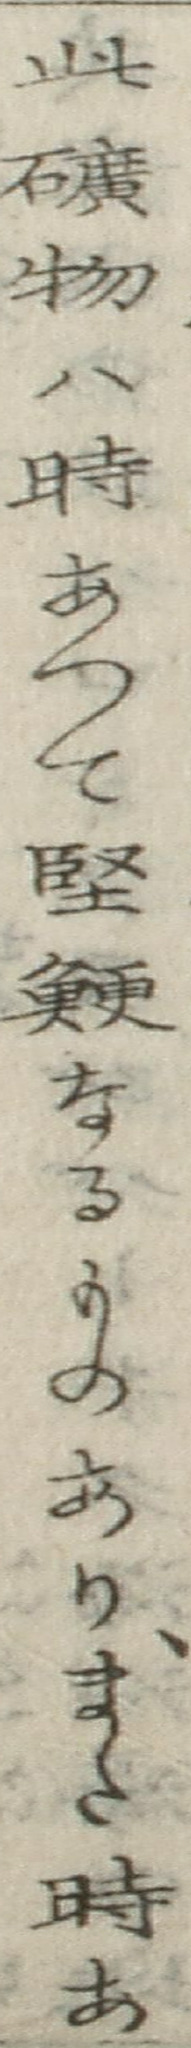此砿物は時あつて堅硬なるものあり、また時あ
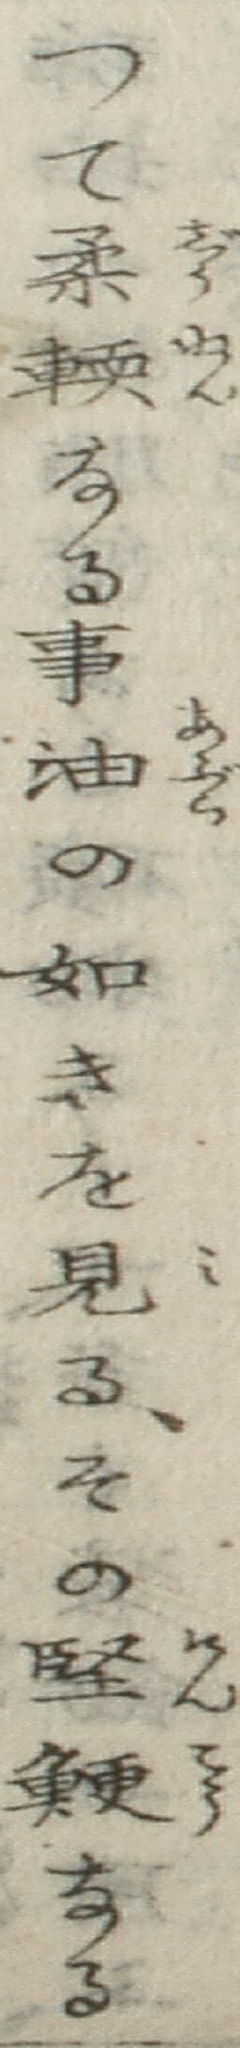つて柔軟なる事油の如きを見る、その堅硬なる
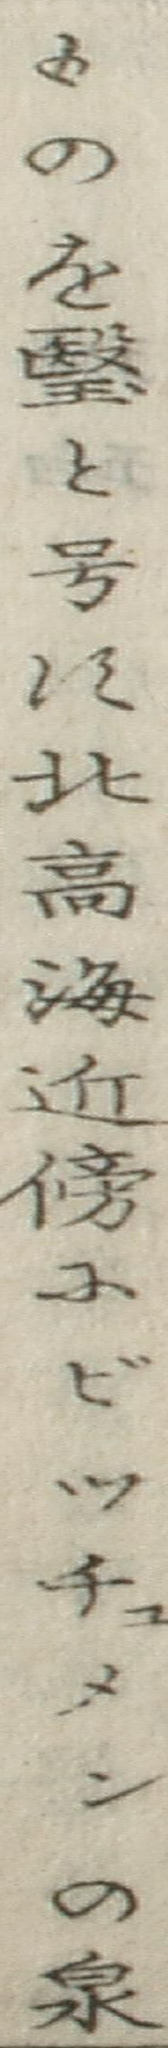ものを毉と号す、北高海近傍にビツチュメンの泉
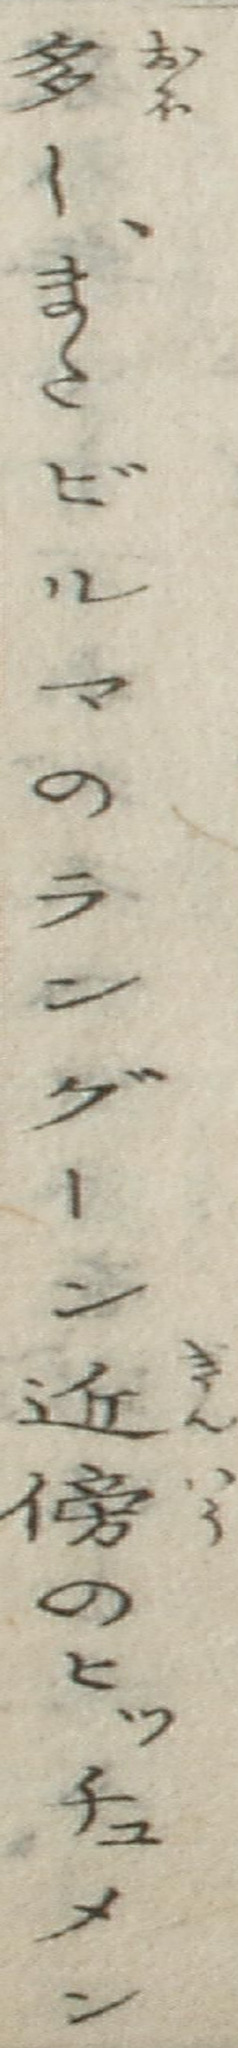多し、またビルマのラングーン近傍のヒッチュメン

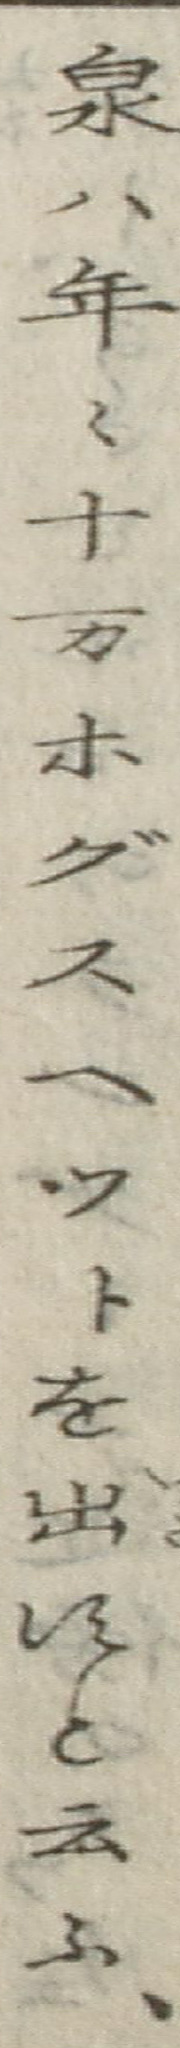泉は、年々十万ホグスヘツトを出すと云ふ、
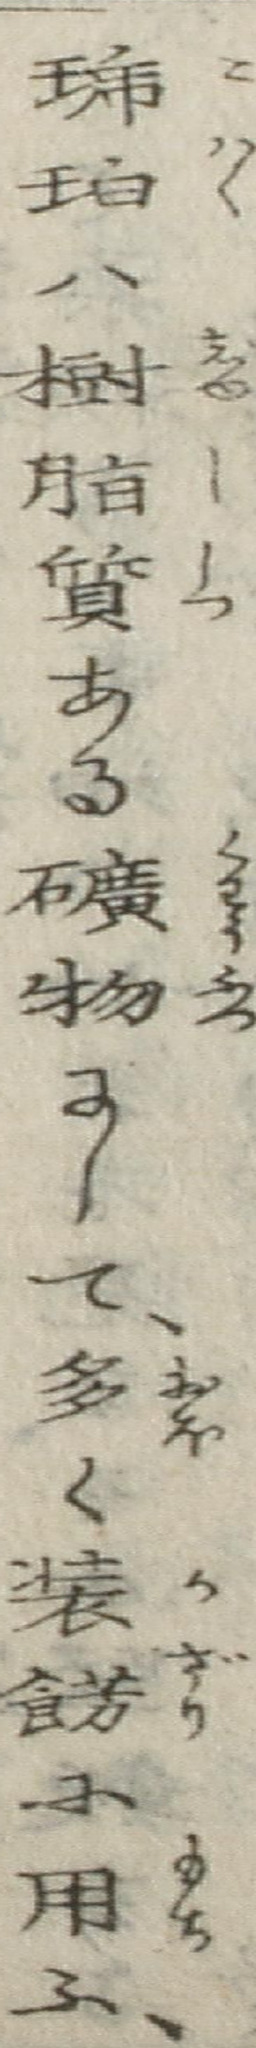琥珀は樹脂質ある砿物にして、多く装飾に用ふ、
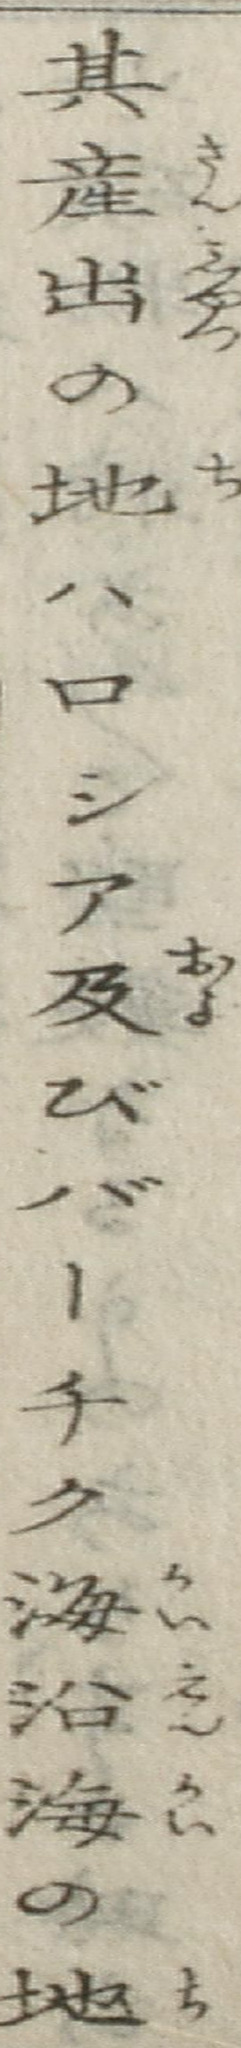其産出の地はロシア及びバーチク海沿海の地
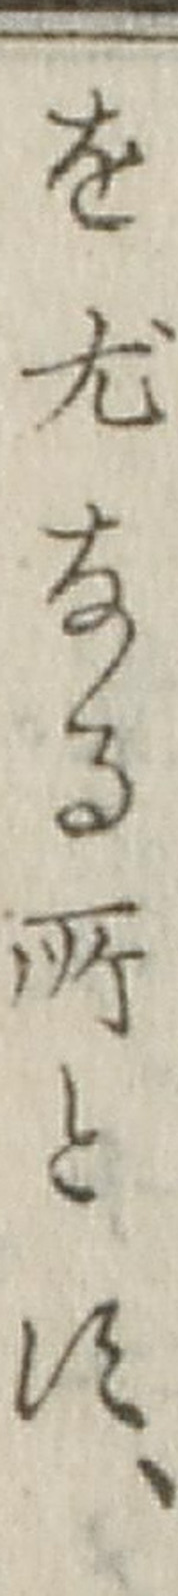を尤なる所とす、
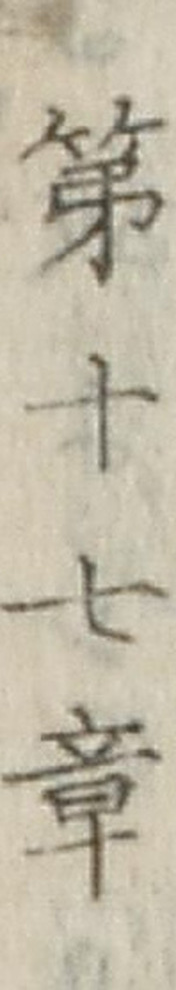第十七章
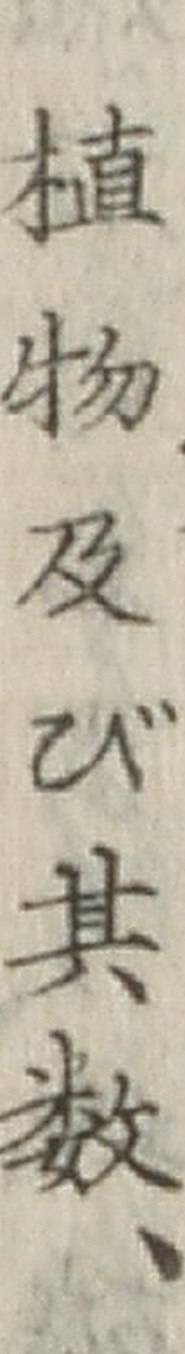植物及び其数、
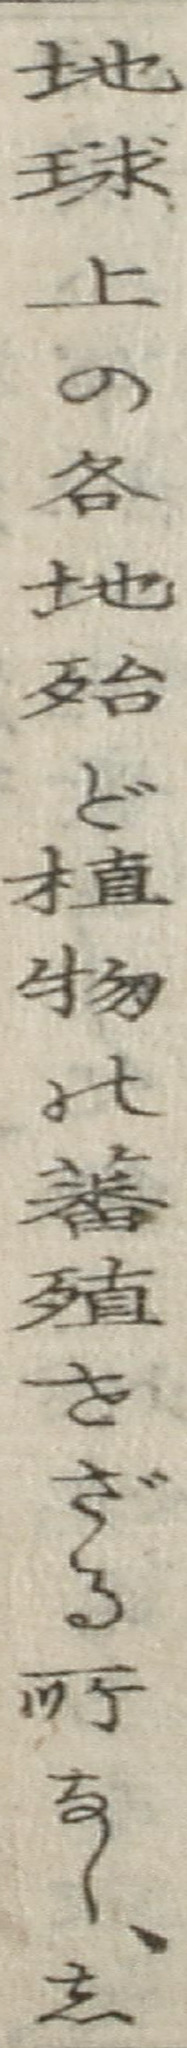地球上の各地殆ど植物の蕃殖せざる所なし、し
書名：訓蒙　天然地理學　下
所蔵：東京大学地震研究所図書室 Earthquake Research Institute Library, The University of Tokyo, JAPAN
